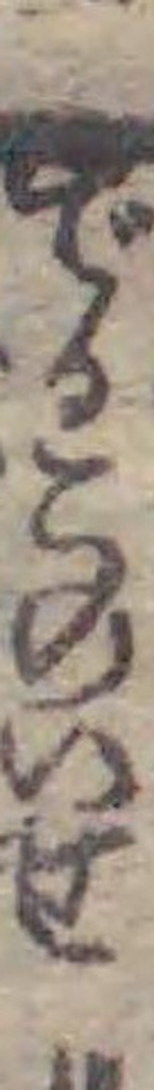でるこのいせ
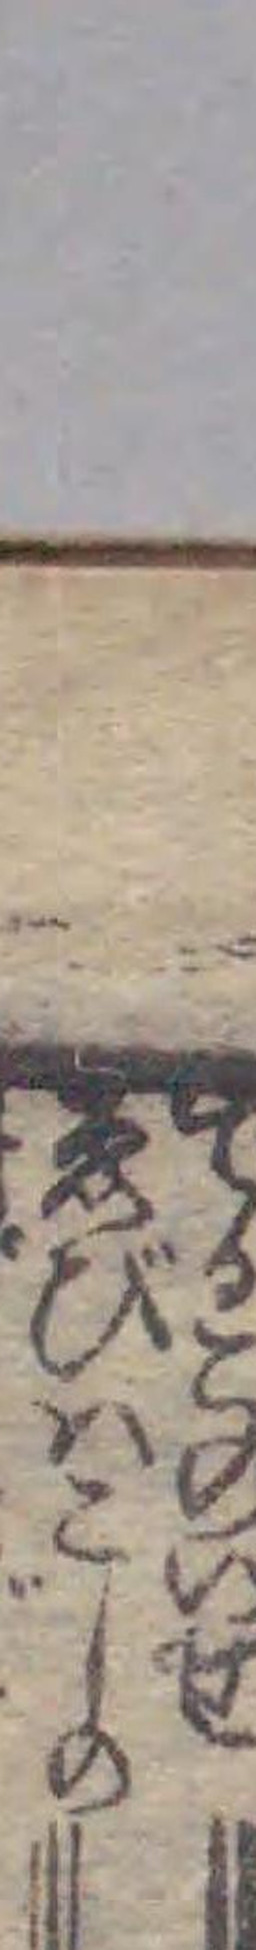ゑびはこしの
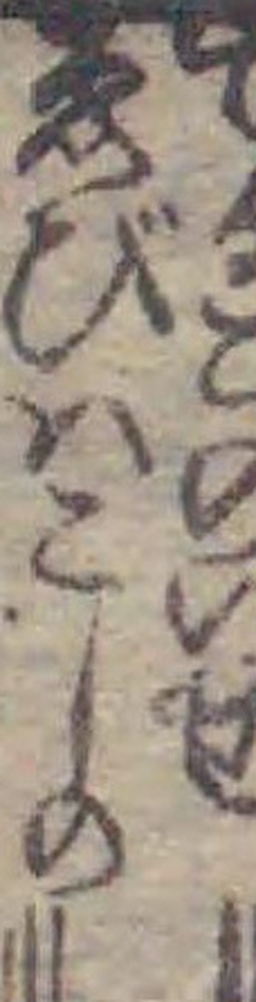ゑびはこしの
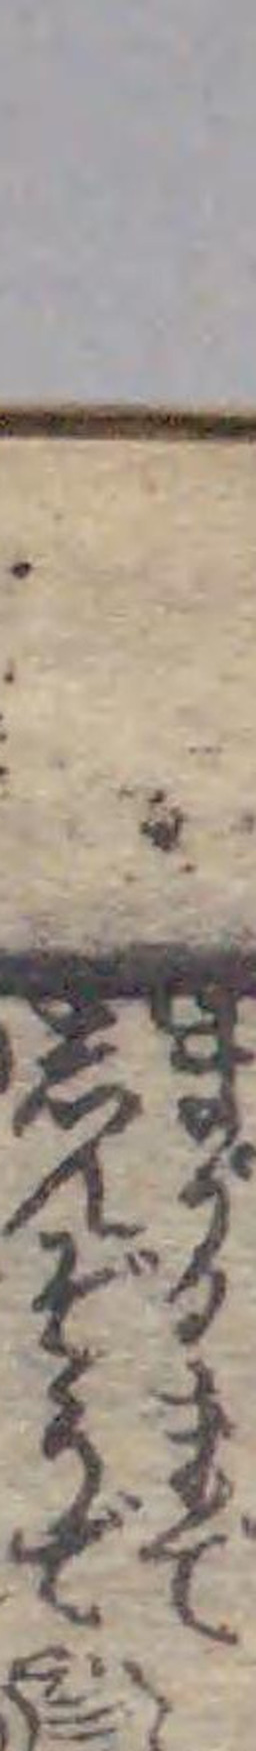しんぞうで
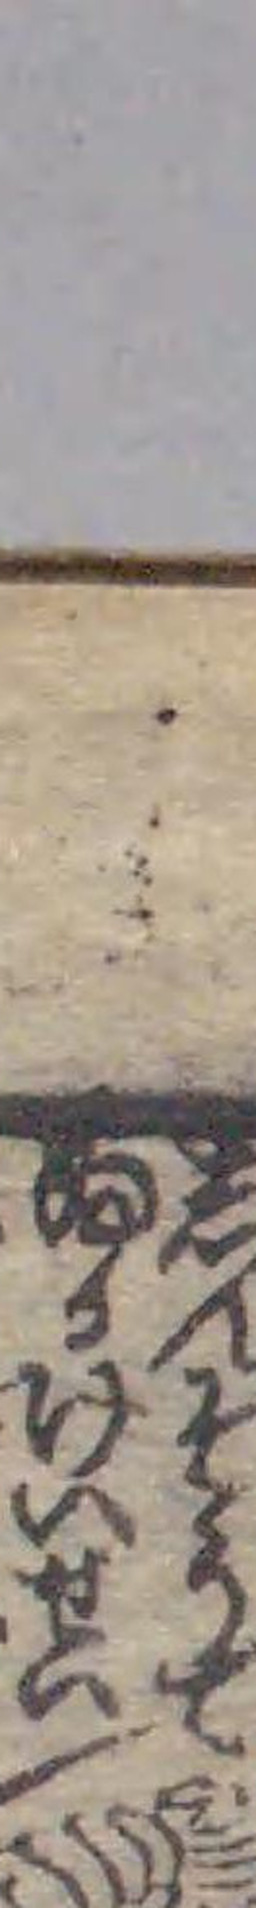ゐるけいせい
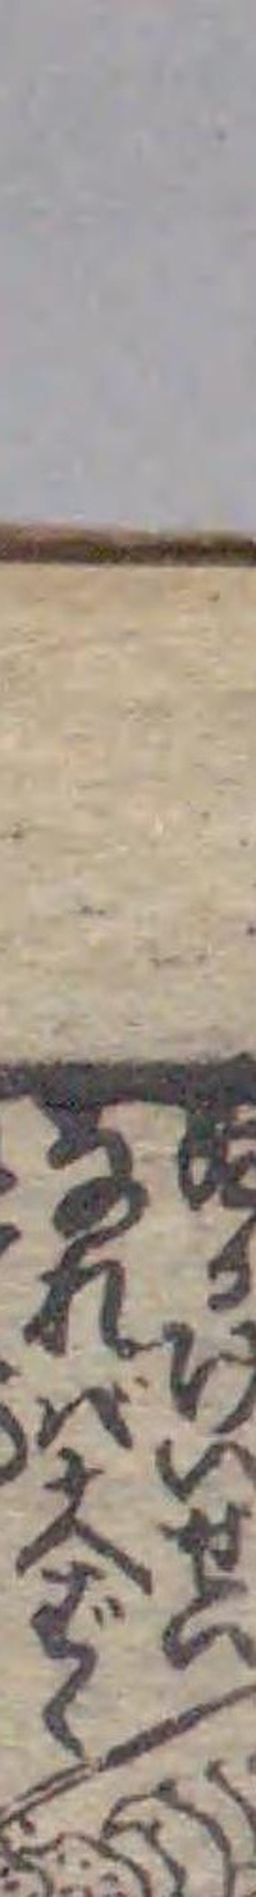なれば大ばゞ
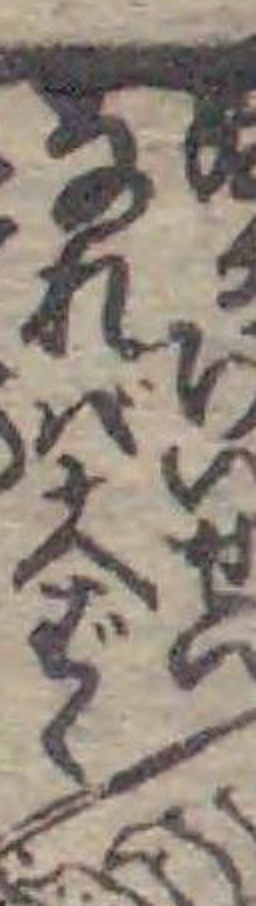なれば大ばゞ
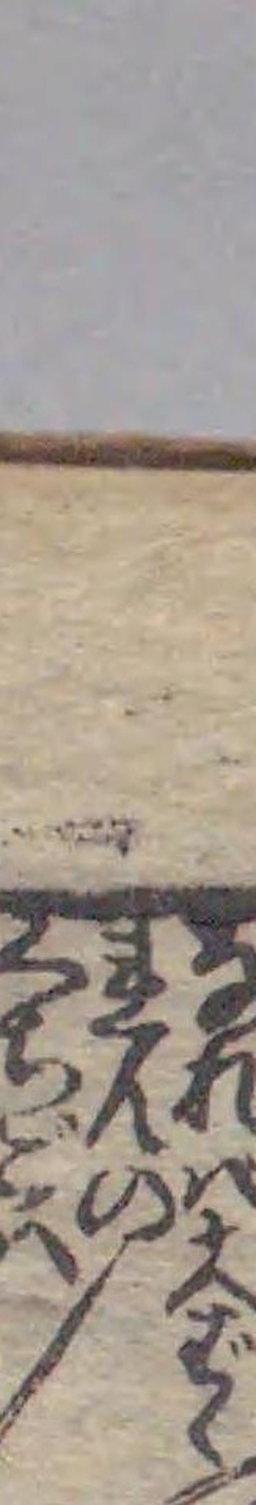くちごは
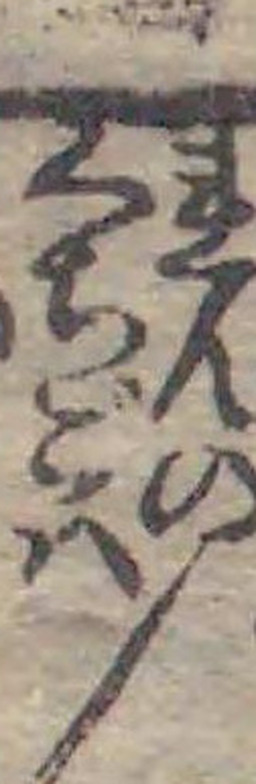くちごは
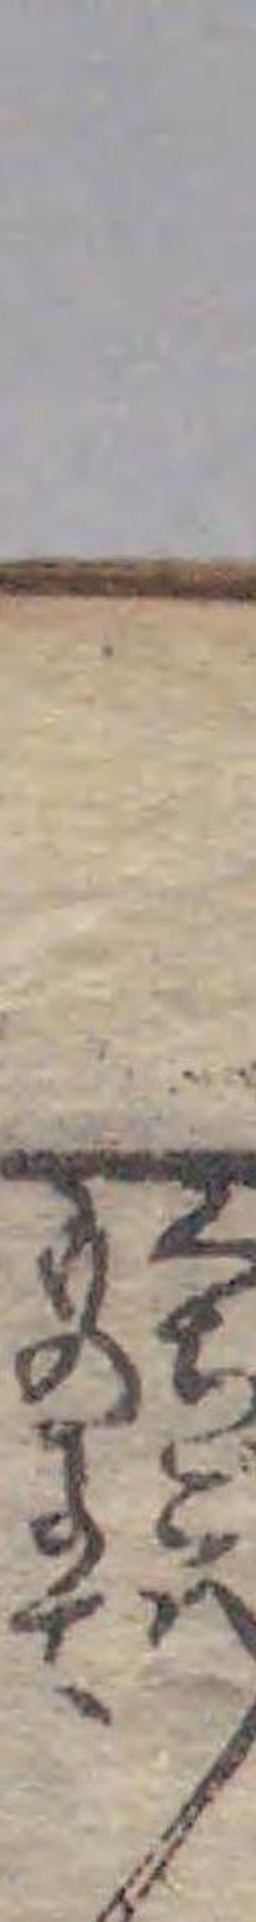ものにて
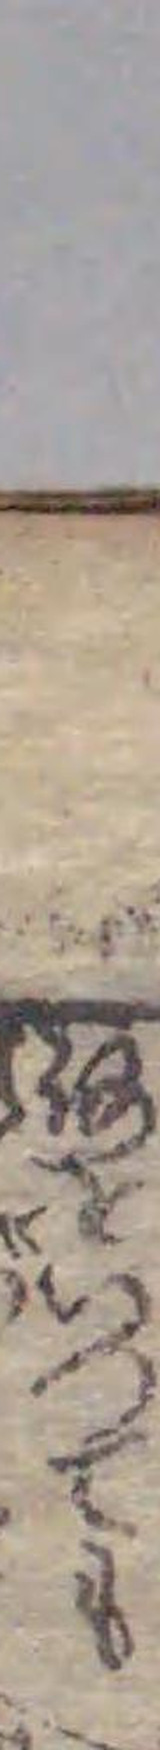何をいつても
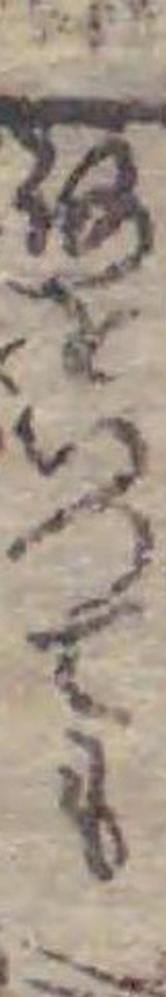何をいつても
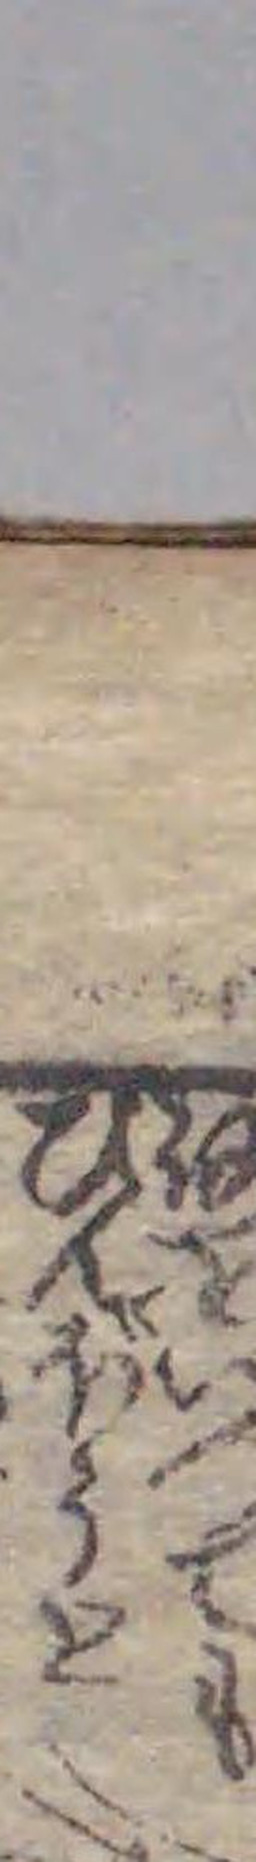びんぼうと
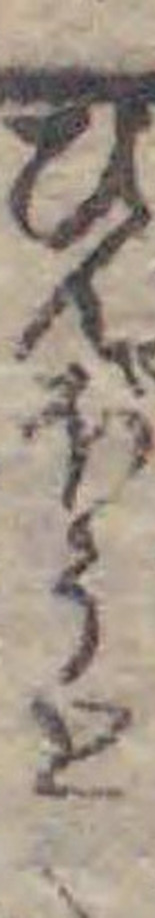びんぼうと
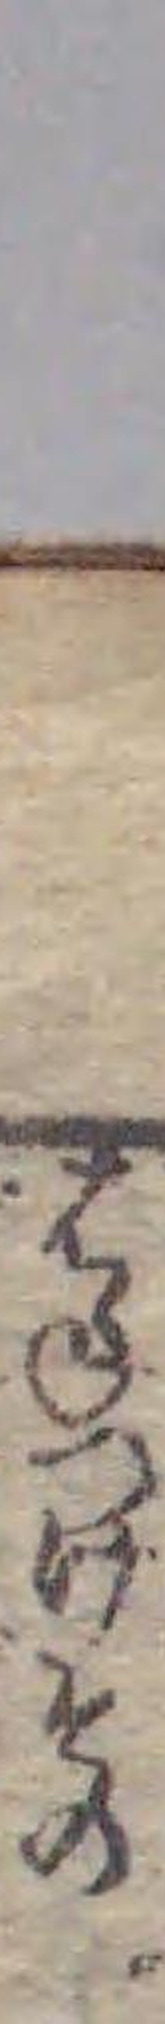はねつけその
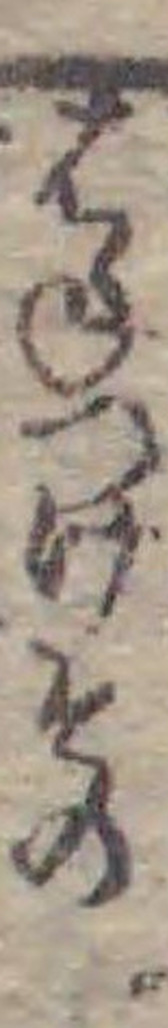はねつけその
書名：竜宮苦界玉手箱 : 3巻
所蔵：国立国会図書館 National Diet Library, JAPAN
